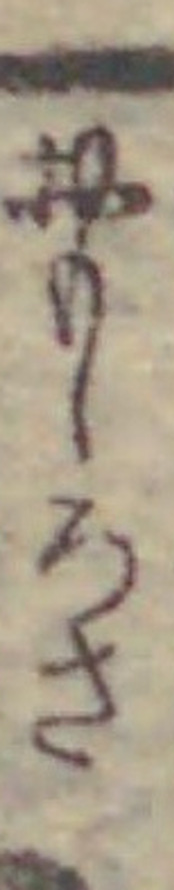おもしろさ
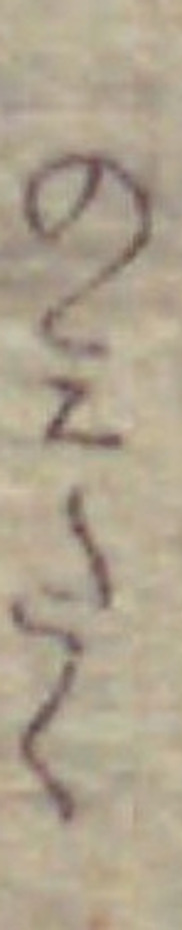のみたく
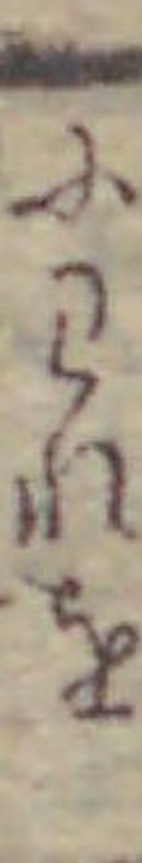にわれを
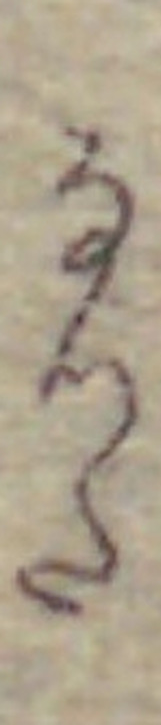なりた
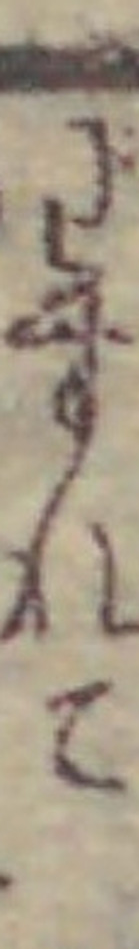わすれて
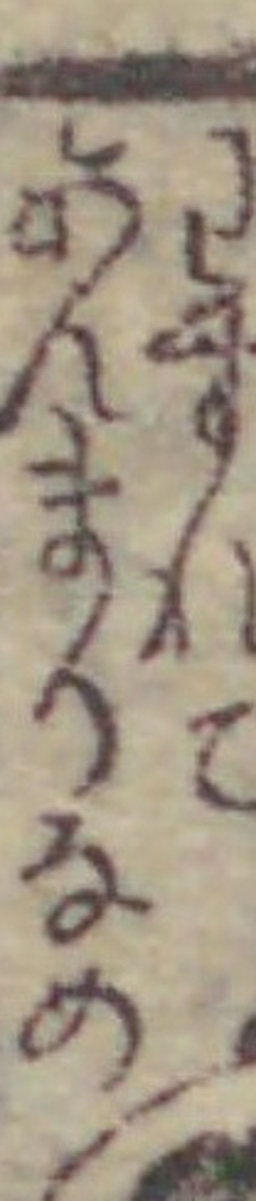あんまりなめ
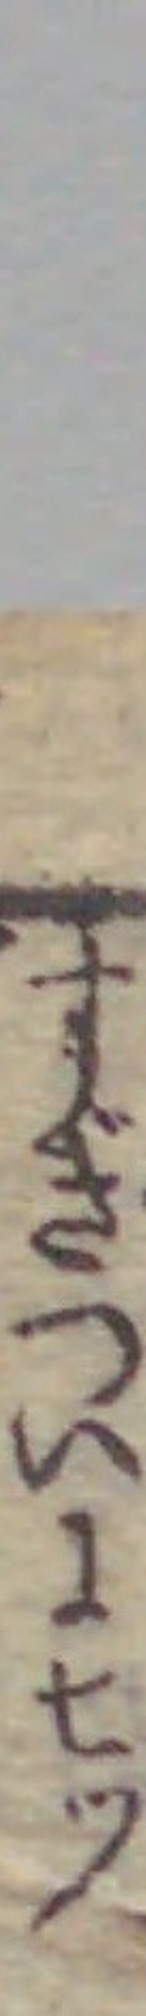すぎついに七つ
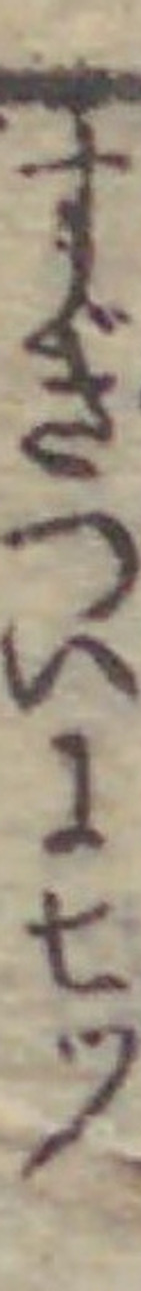すぎついに七つ
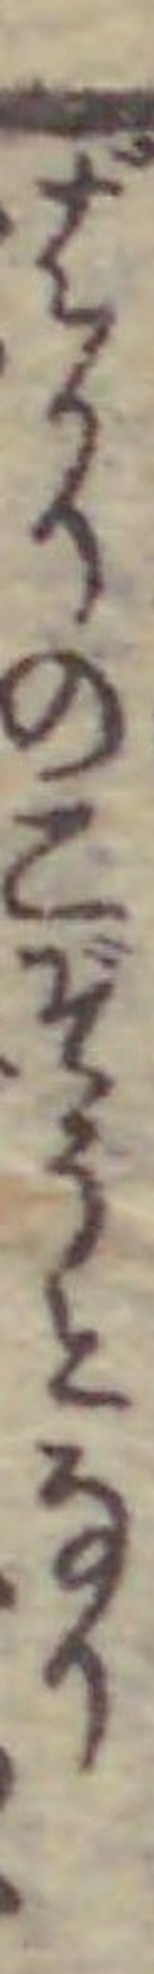ばかりのこぞうとなり
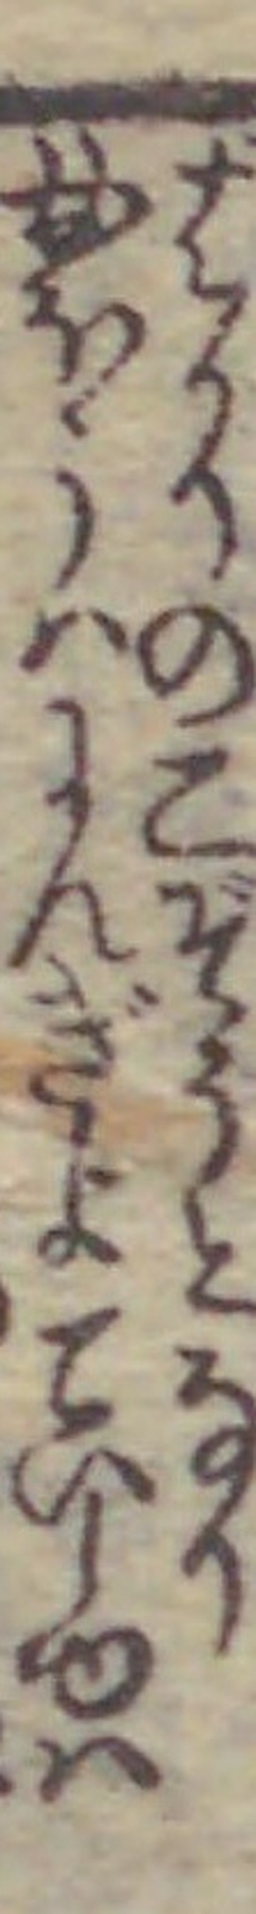女ほうはにんぎよていしゆは
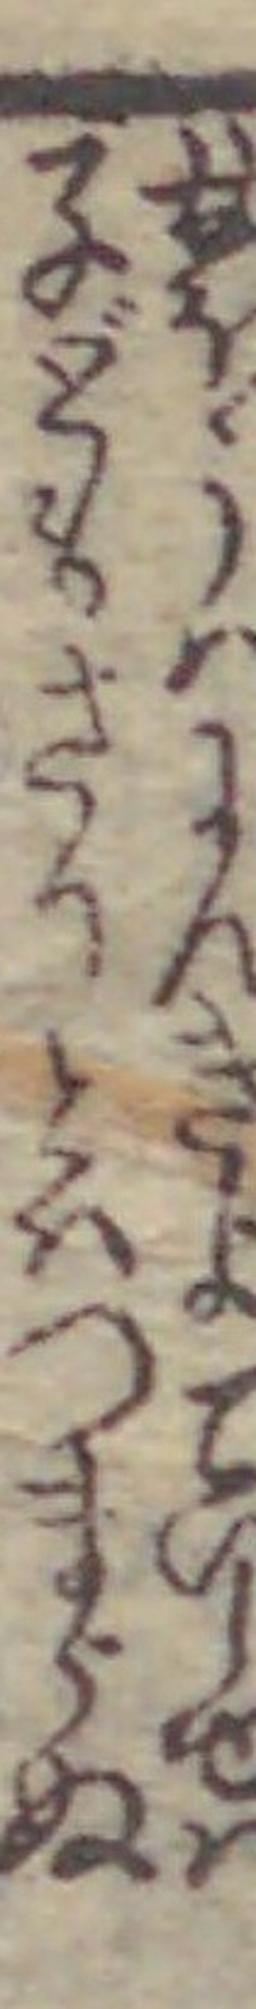子どもさりとはつまらぬ
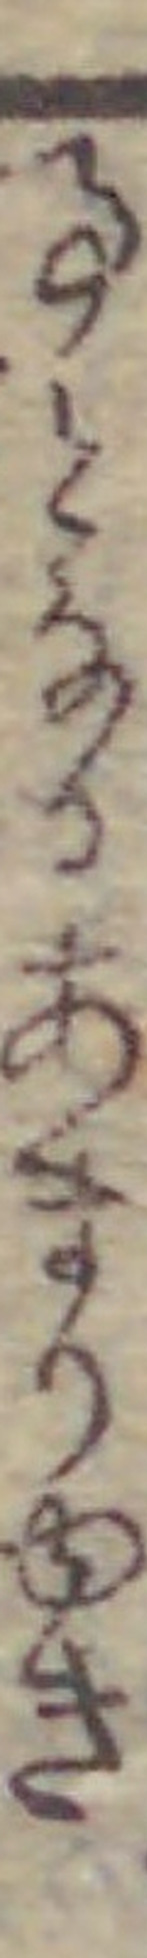事となるあまりゆき
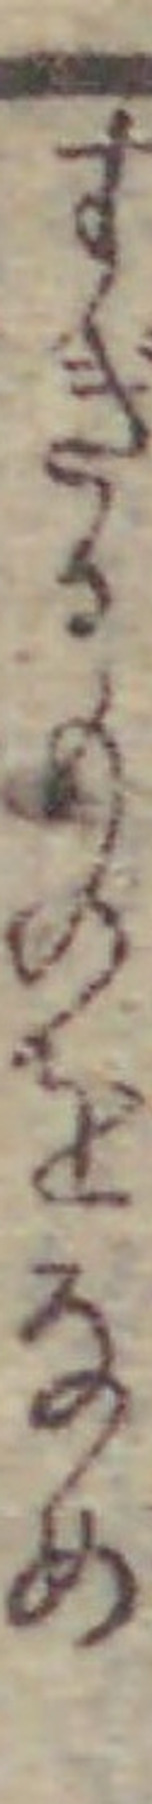すぎるものをなめ
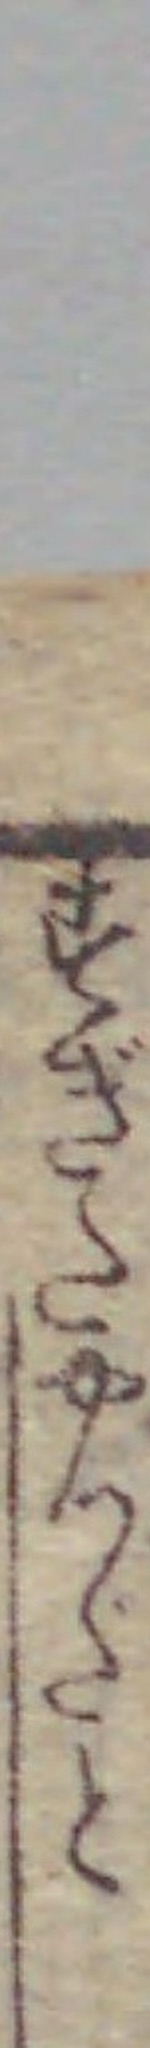すぎたやつだと
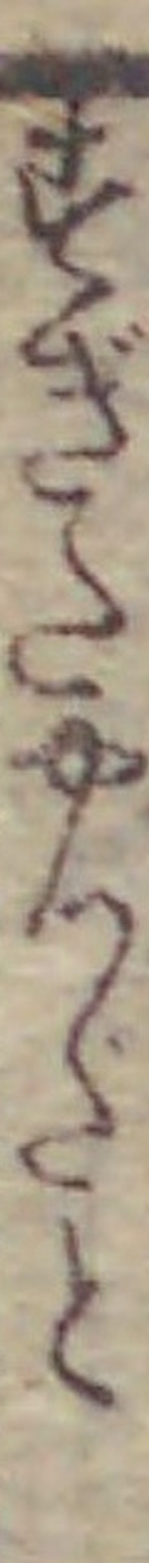すぎたやつだと
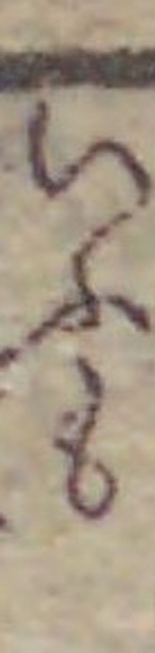いふも
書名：箱入娘面屋人魚 3巻
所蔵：国立国会図書館 National Diet Library, JAPAN
